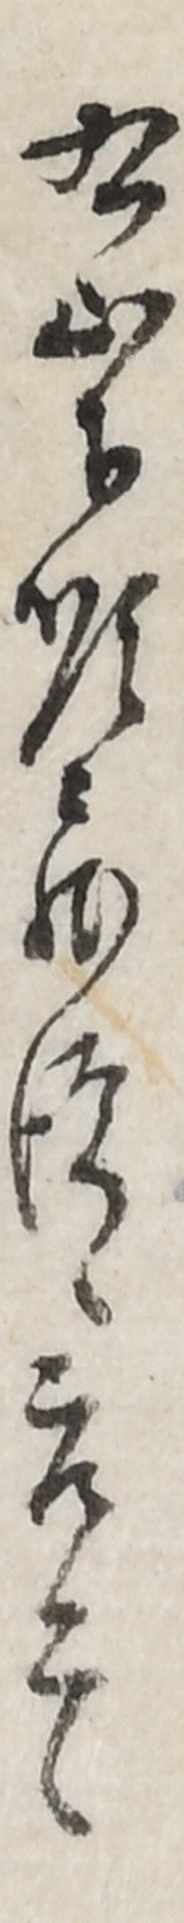右山下順蔵様へ差上候

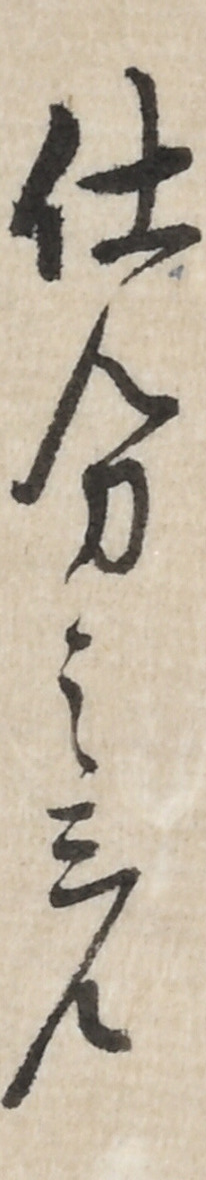仕分之覚
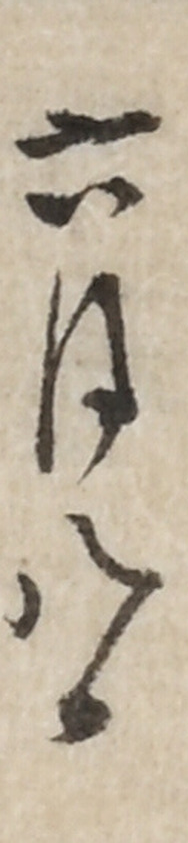六月八日
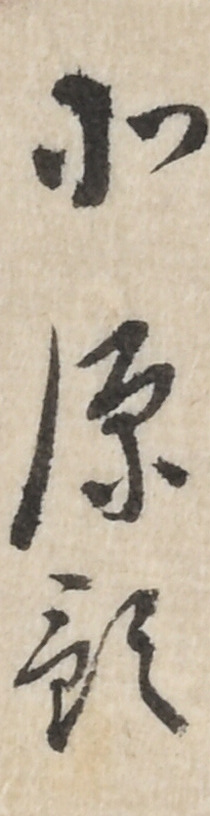北原預
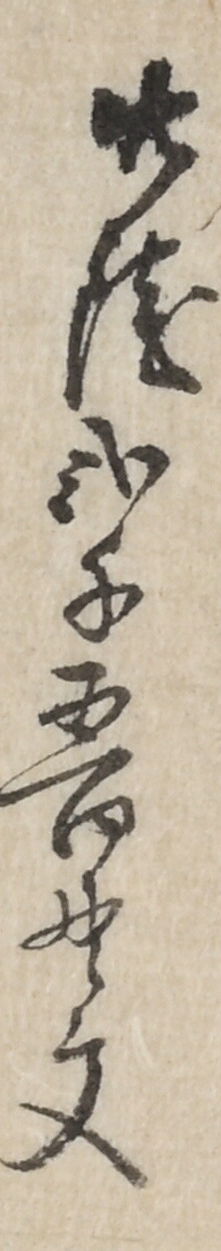此銭弐千五百貫文
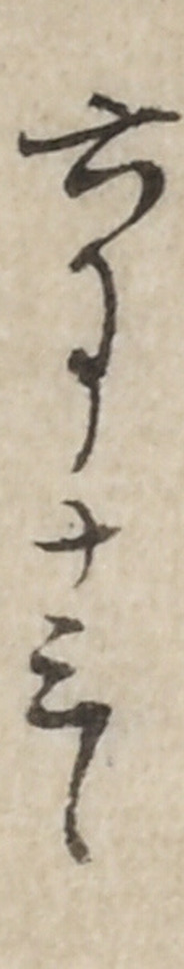六月十三日
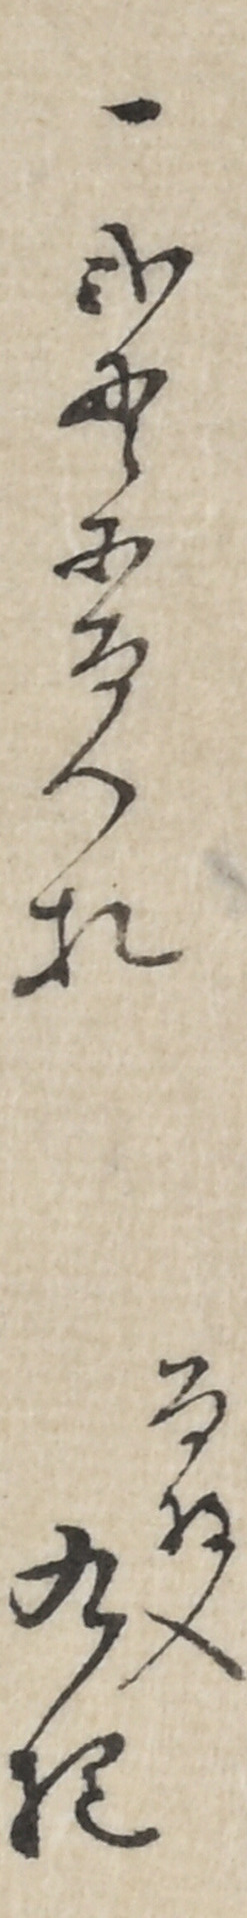一弐貫五百人札百枚入
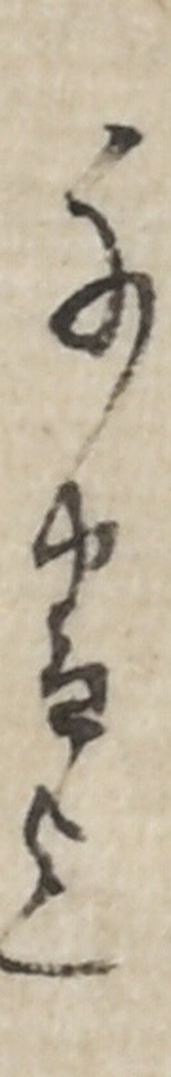千番迄
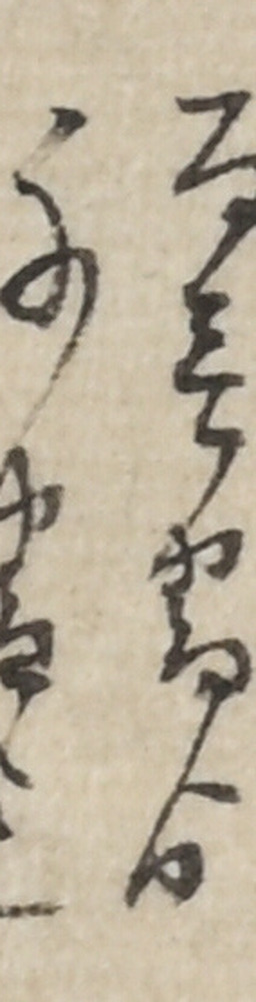千番迄
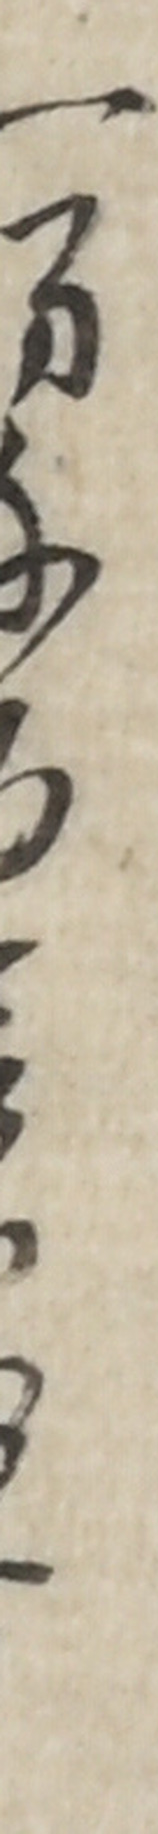一万千百壱番ゟ

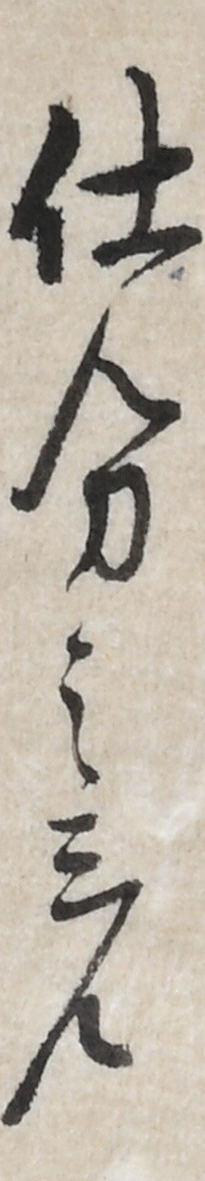仕分之覚
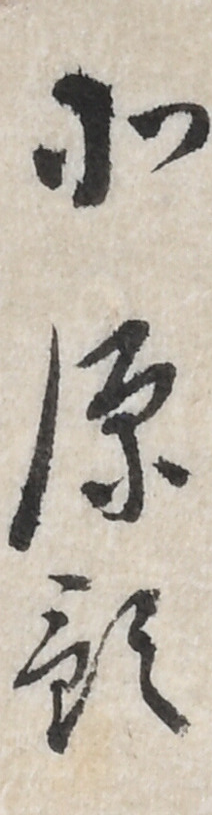北原預
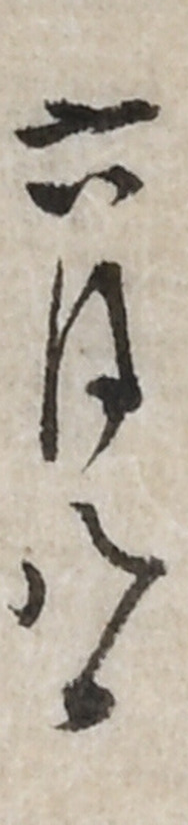六月八日
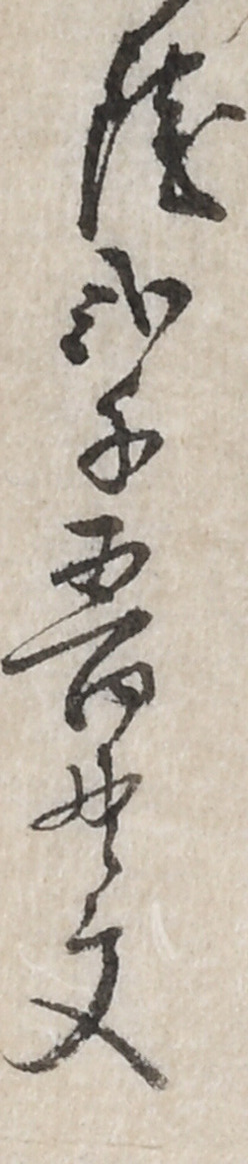此銭弐千五百貫文
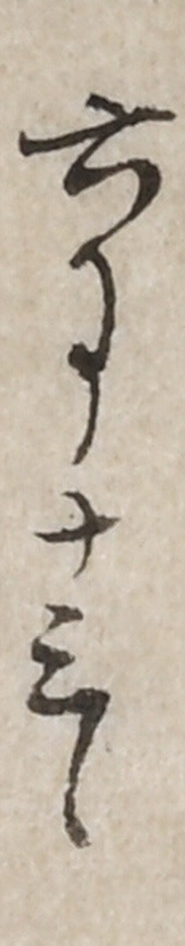六月十三日
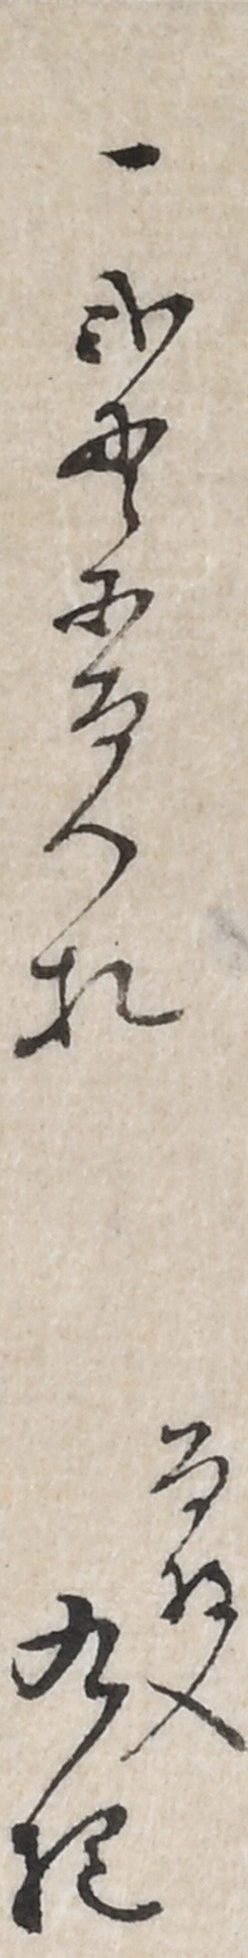一弐貫五百人札百枚入
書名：髙遠限楮幣引換ニ付御下ケ渡控
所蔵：伊那市立高遠町図書館・合同会社AMANE
